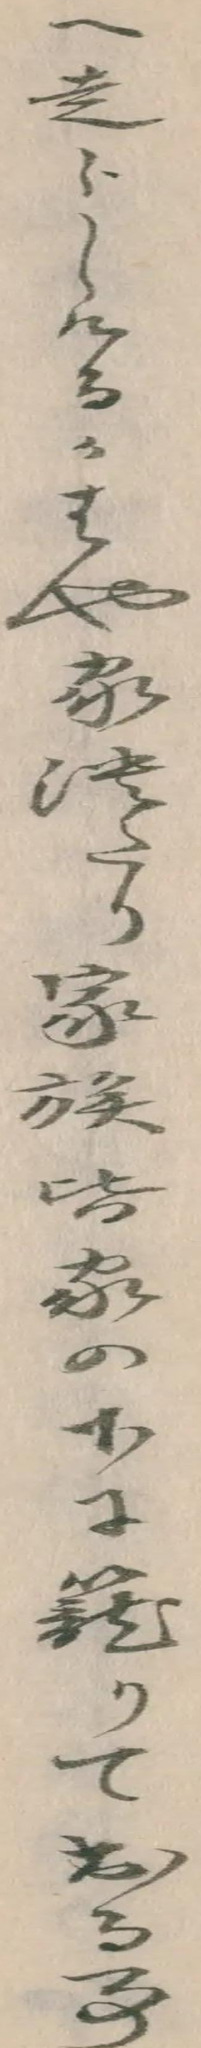へ走らしけるかはや家潰たり家族皆家の下に籠りて出る事
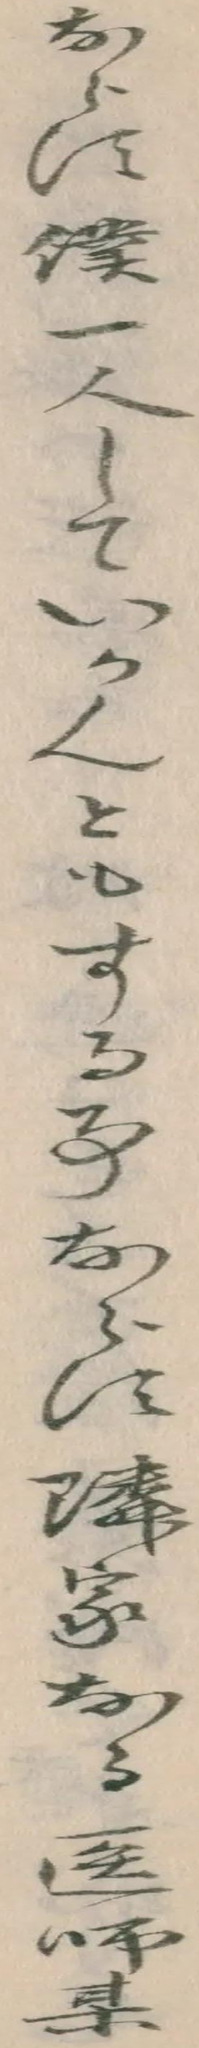ならす僕一人していかんともする事ならす隣家なる医師某
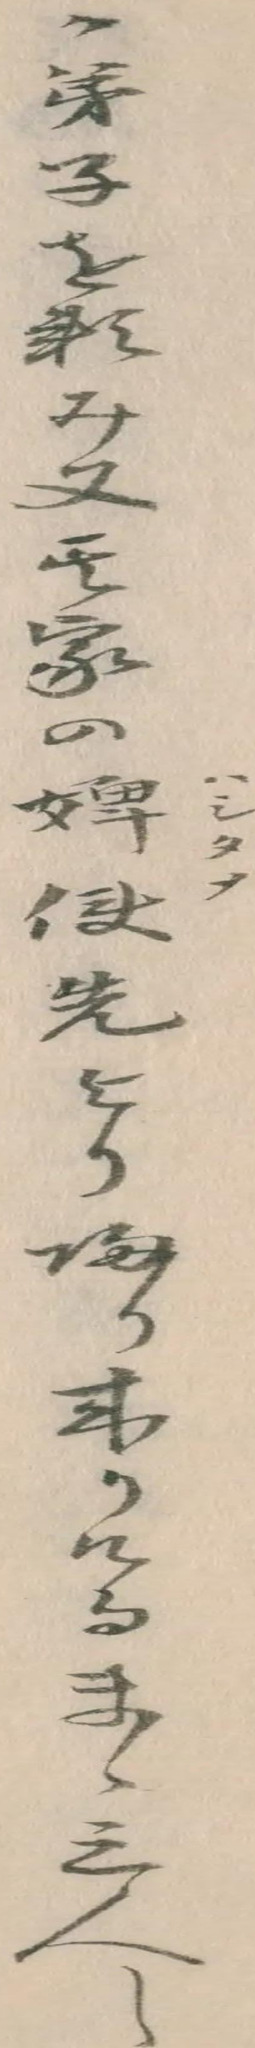か弟子を頼み又其家の婢使先より帰り来りけるまゝ三人し
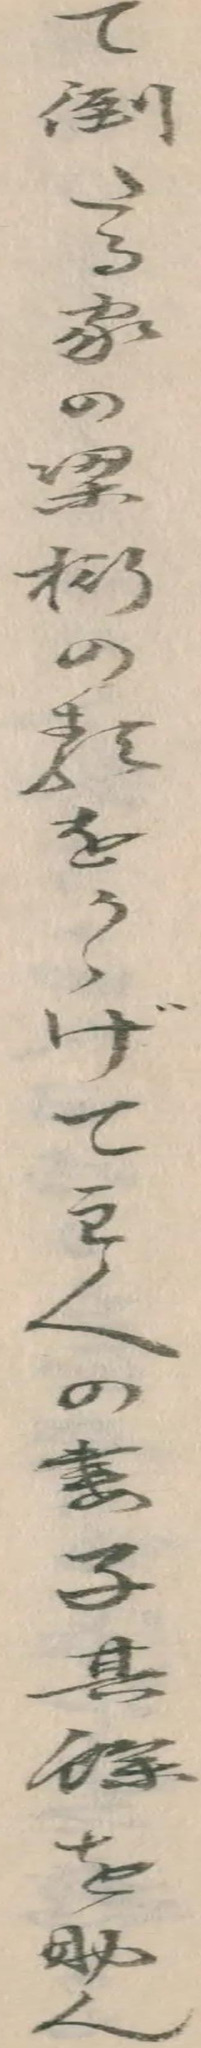て倒たる家の梁桁の類をかゝげて主人の妻子其余を助ん
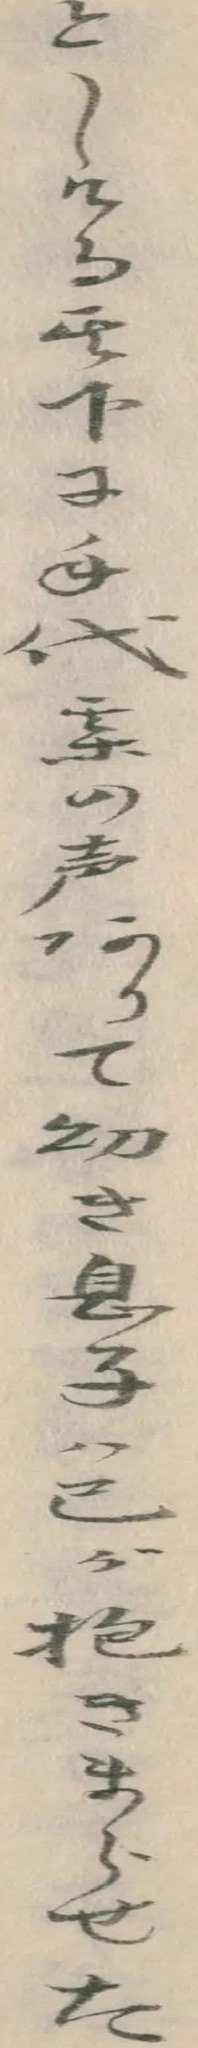としける其下に手代某の声ありて幼き息子は己が抱きまらせた
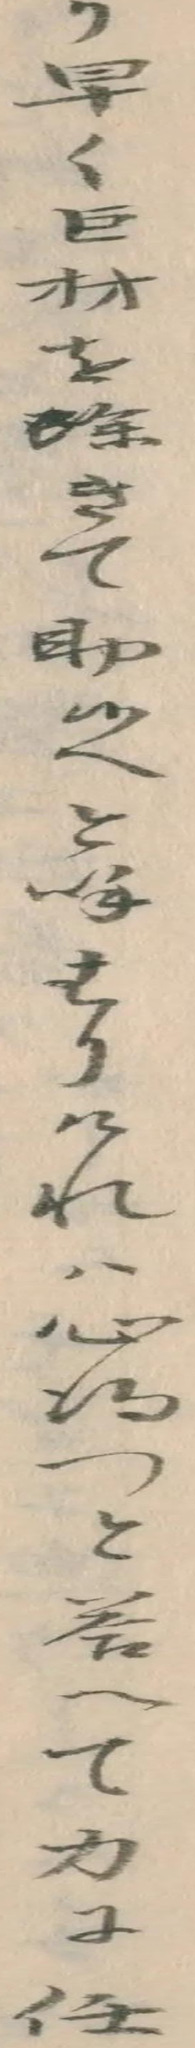り早く巨材を除きて助候へと呼はりけれは心得つと答へて力に任

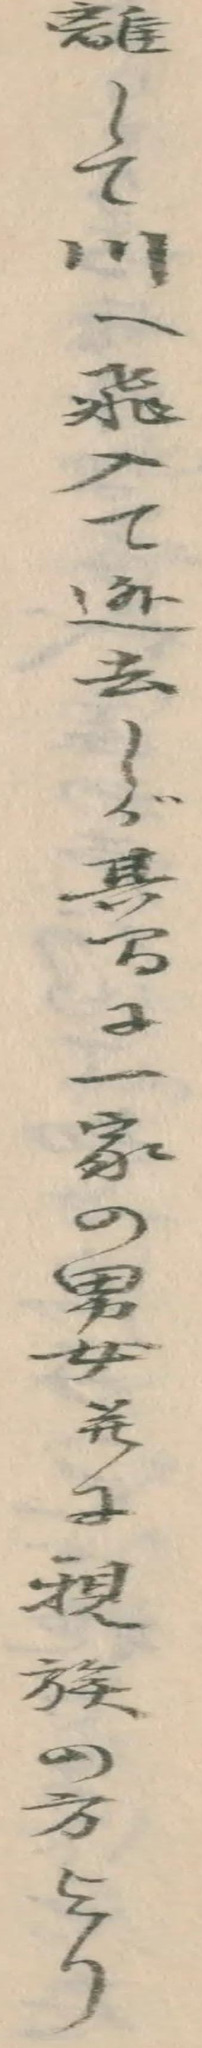離して川へ飛入て逃去しが其間に一家の男女并に親族の方より
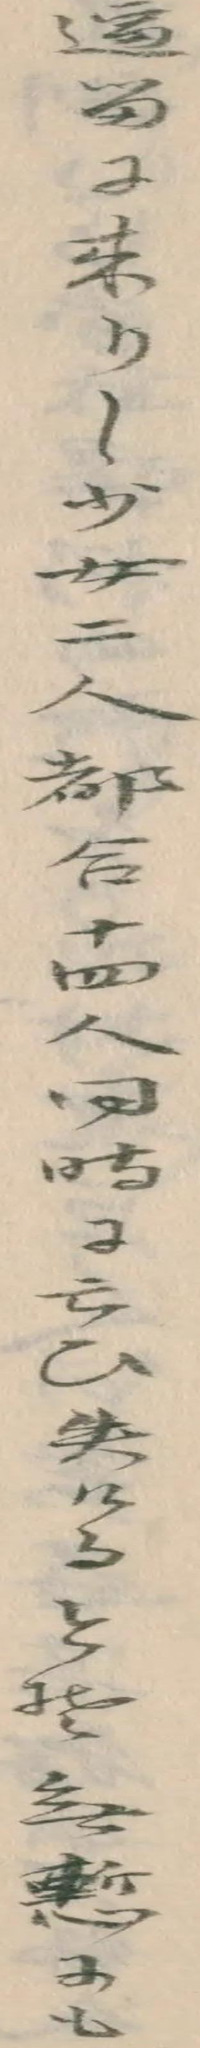逼るに来りし少女二人都合十四人同時に亡ひ失けるとそ無慙にも
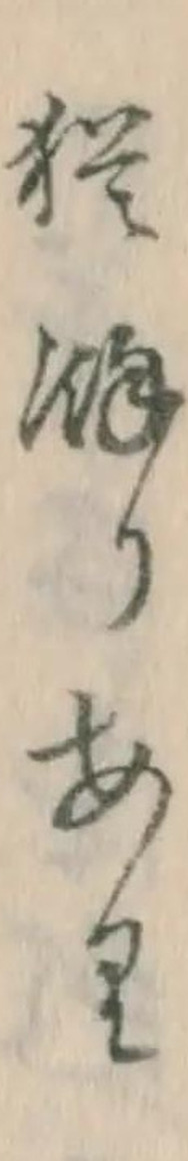猶余りあり
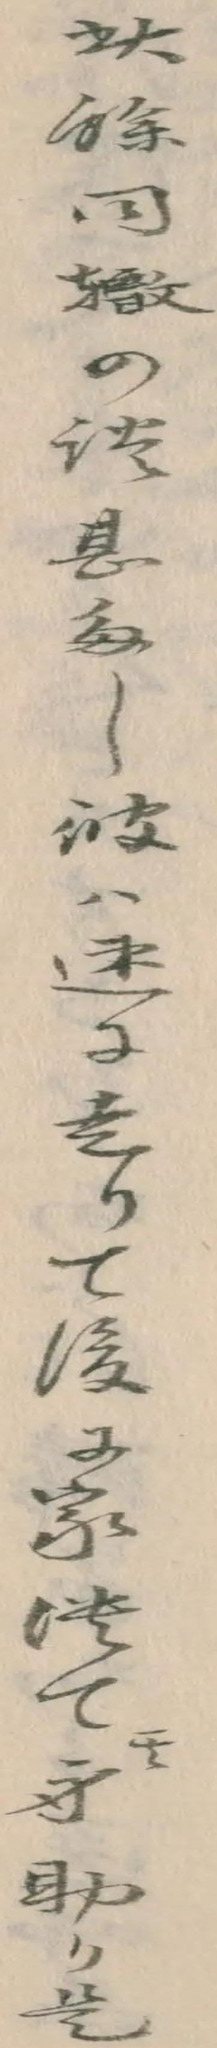此余同轍の談甚多し彼は速に走りて後に家潰て其身助り是
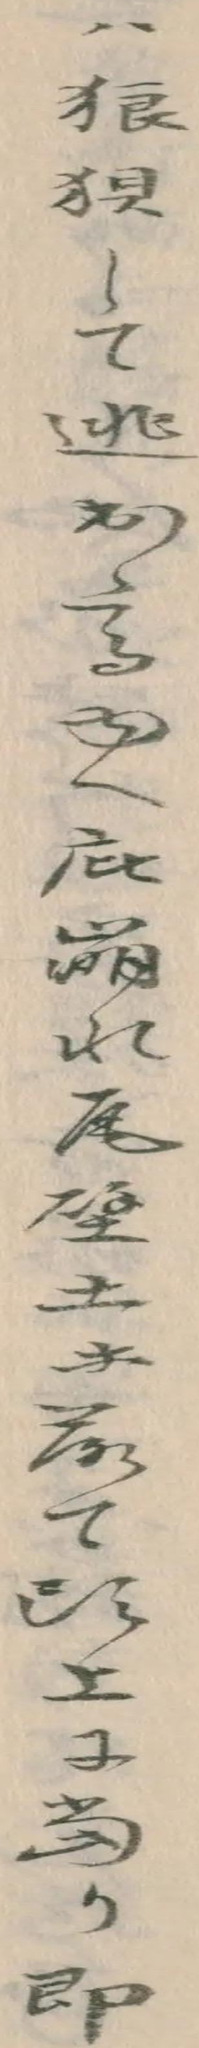は狼狽して逃出たるゆへ庇崩れ瓦壁土等落て頭上に当り即
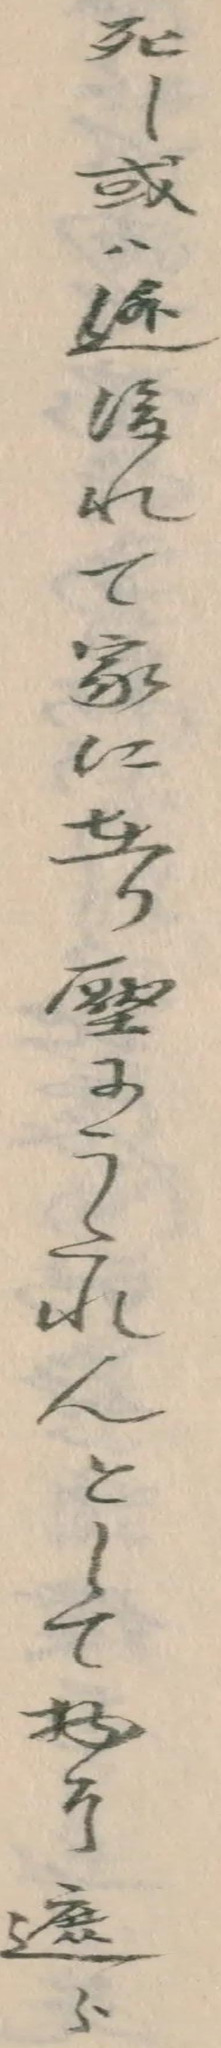死し或は逃後れて家に在り圧にうたれんとして物に遮ら
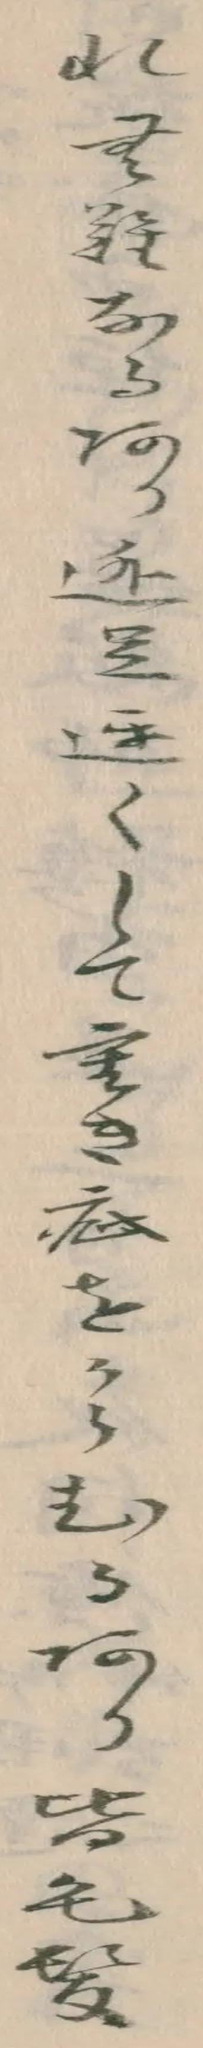れ無難なるあり逃足速くして重き疵をかうむるあり皆毛髪
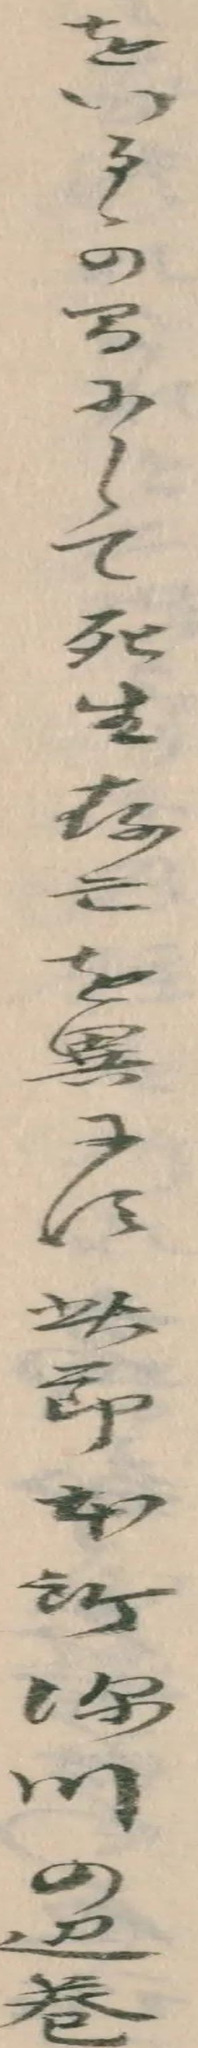をいるゝの間にして死生存亡を異にす此節本所深川の辺巻
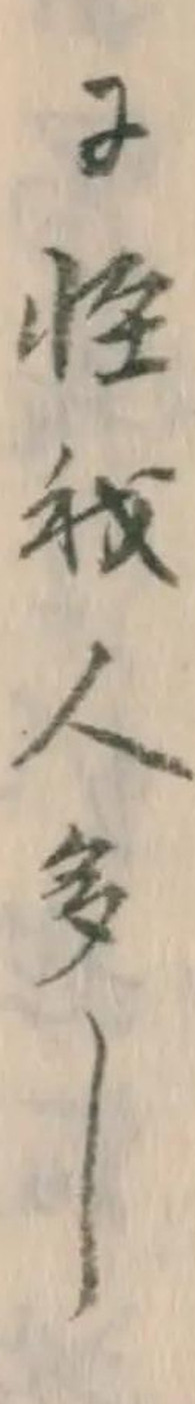に怪我人多し
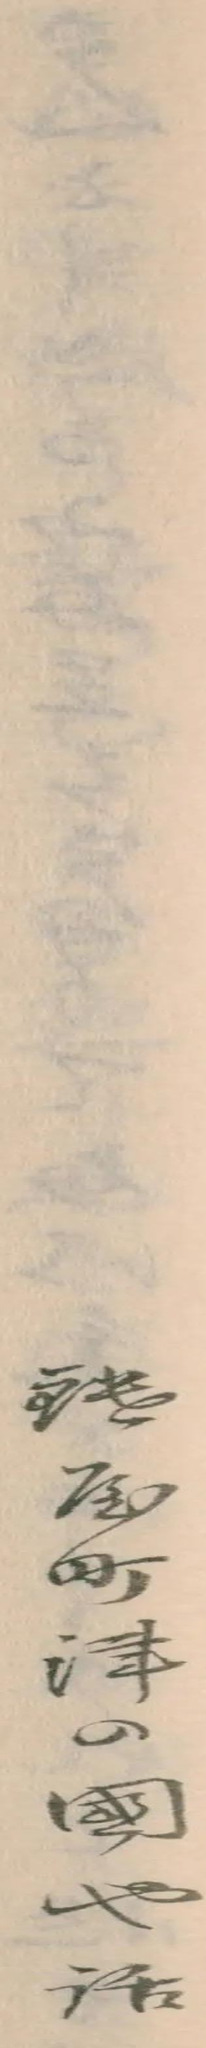鑓屋町津の国や話
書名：地災撮要. 巻7-9(地震之部)
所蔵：国立国会図書館 National Diet Library, JAPAN
